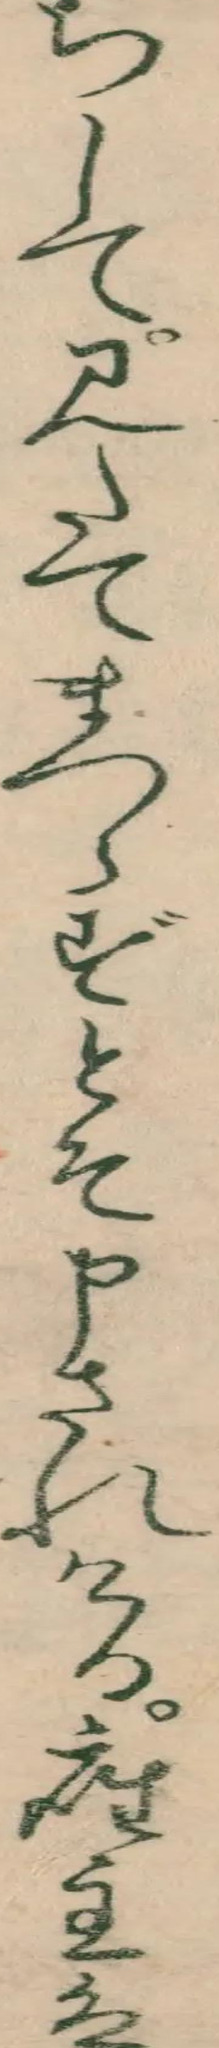ちして。見たてまつらずとそ申されける。座主は
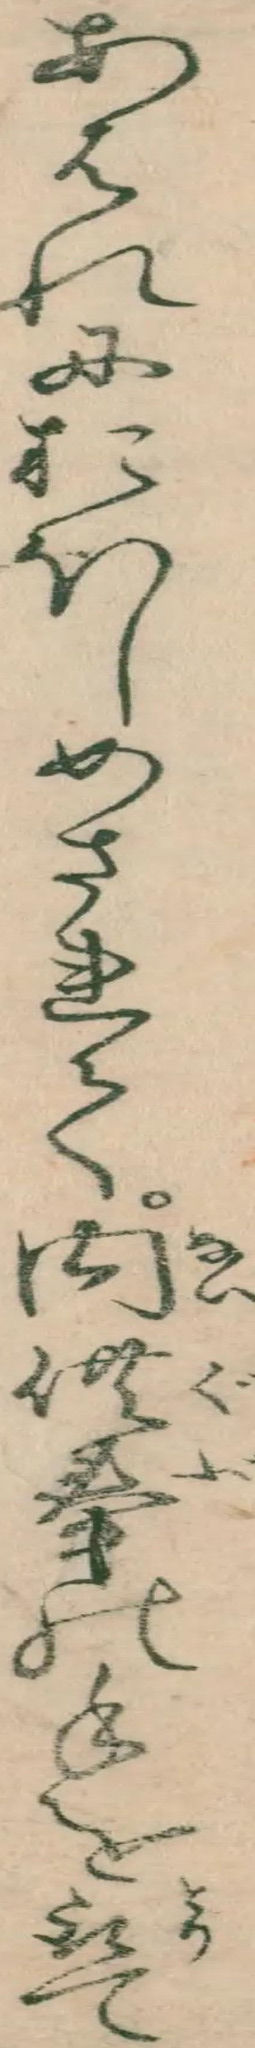あはれにおほしめされて。内供奉のてを取て
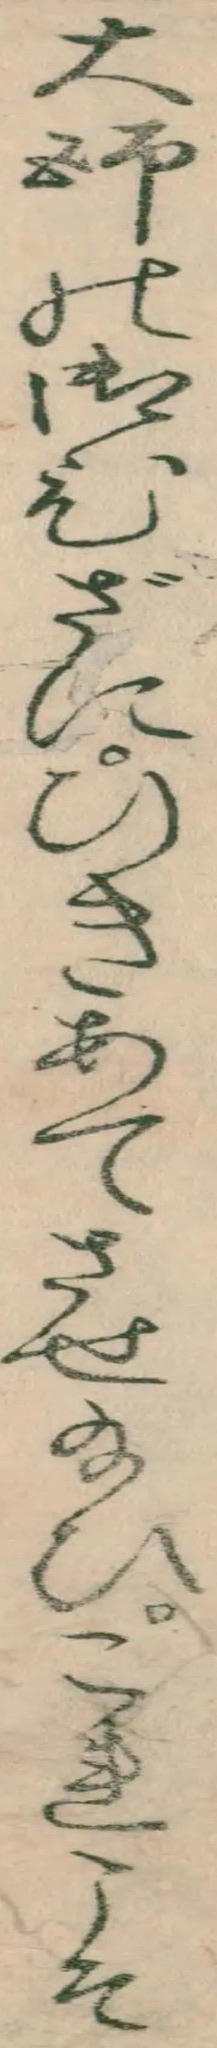大師の御ひざに。ひきあてさせ給ひ。これこそ
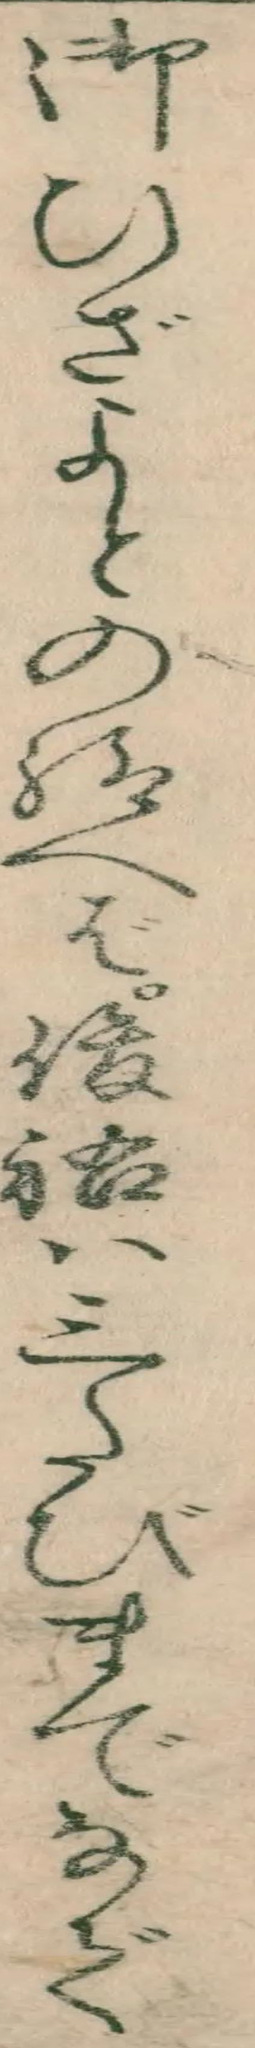御ひざよとの給へば。俊祐はみたびまでなで
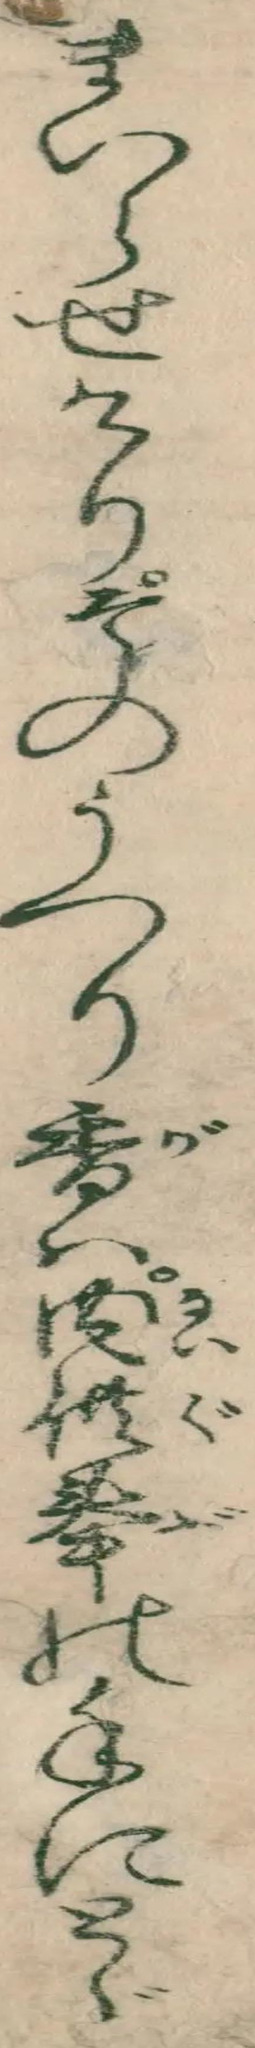まいらせけり。そのうつり香は。内供奉のてにとゞ
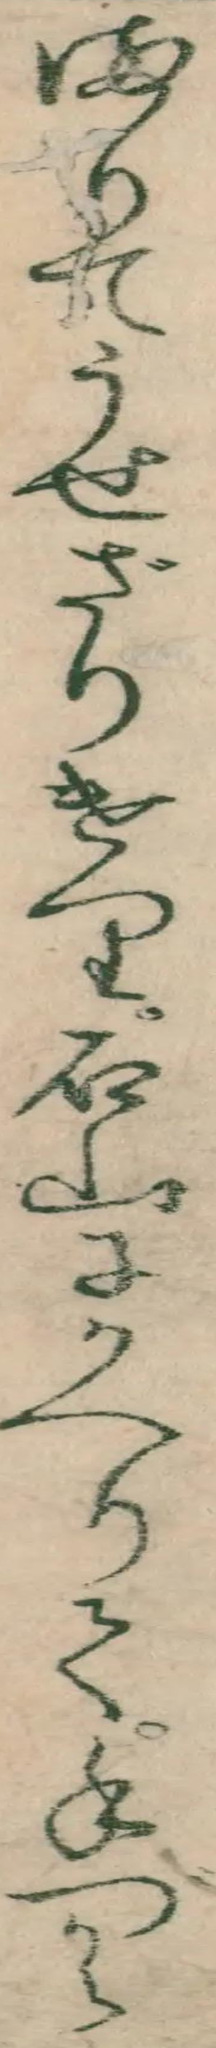まりてうせざりけり。石山にかへりて。手づから
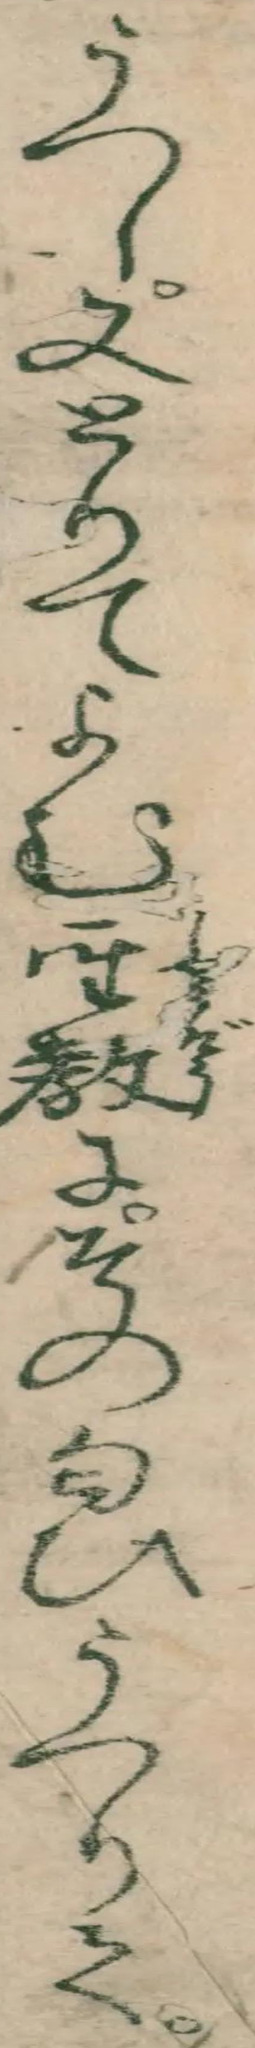うつし。又とりてよむ聖教に。その匂ひうつりて。

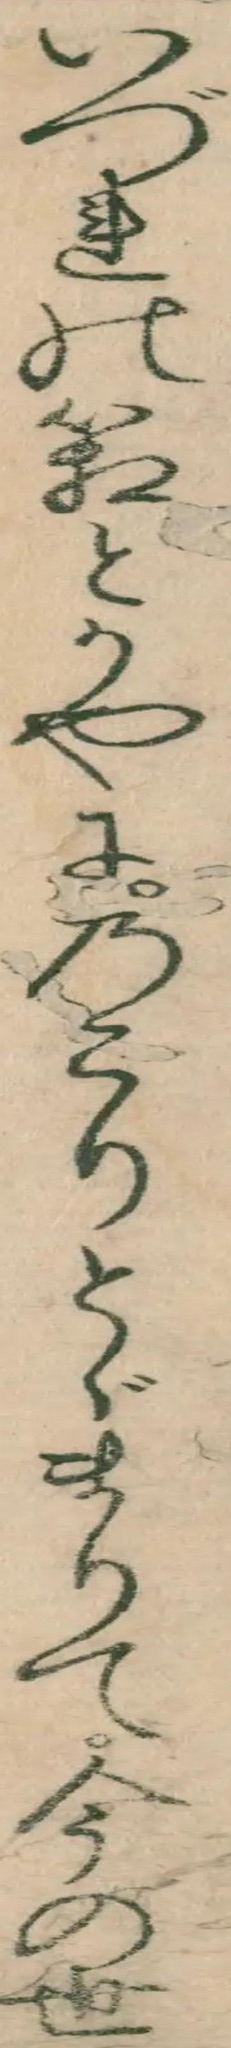いづれの箱とかやに。のこりとゞまりて。今の世
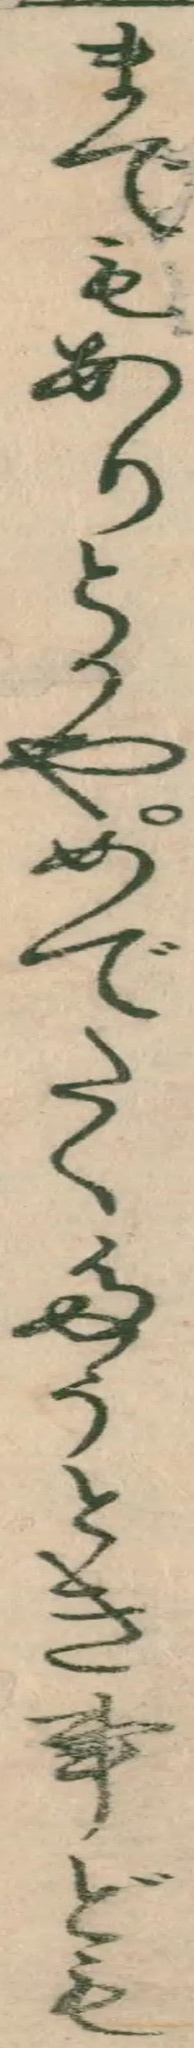までもありとかや。めでたくたうとき事ども
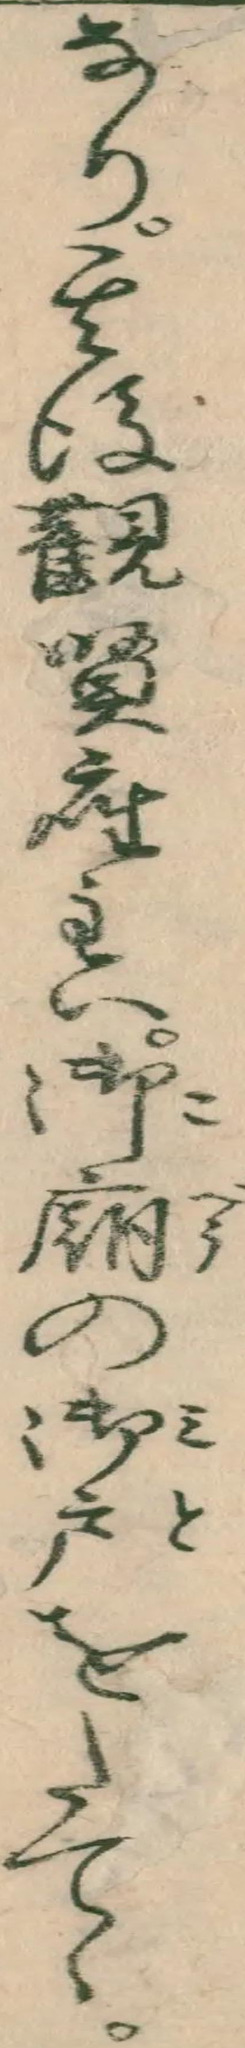なり。其後観賢座主は。御廟の御戸をたてゝ。
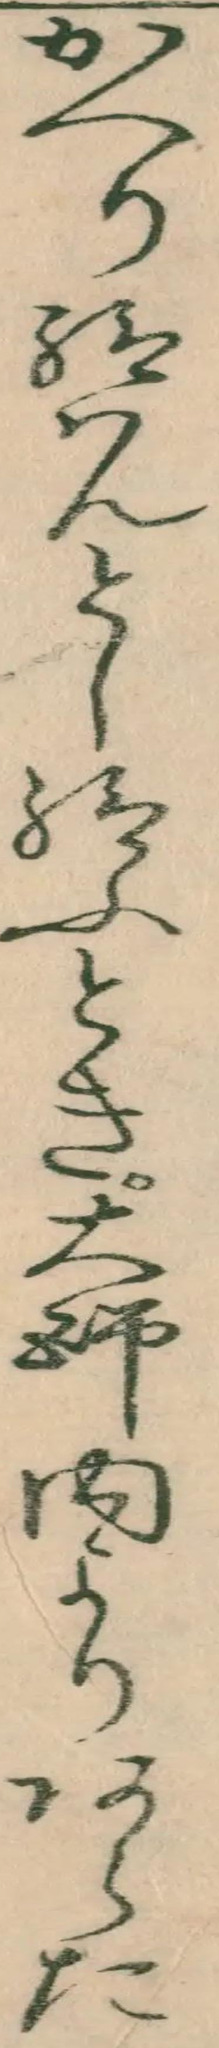かへり給はんとし給ふとき。大師内よりあらた
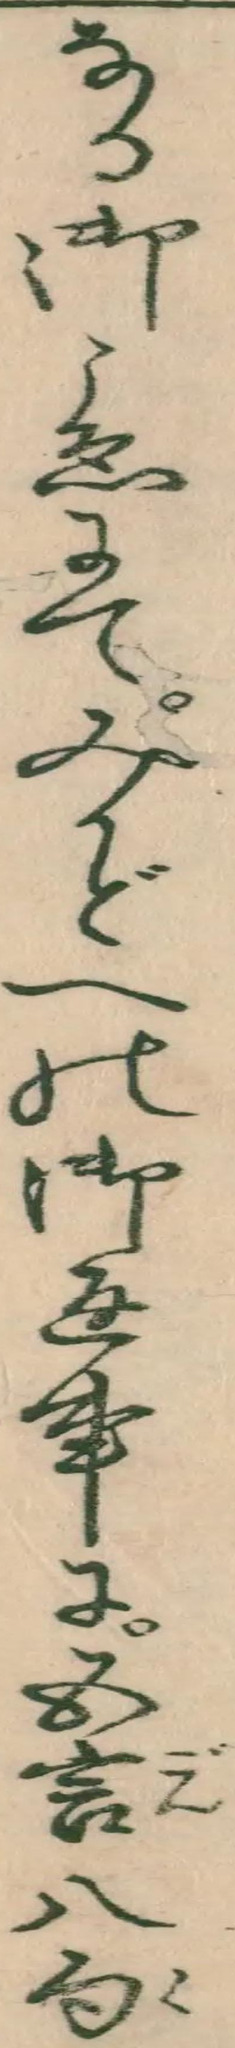なる御こゑにて。みかどへのお返事に。五言八句
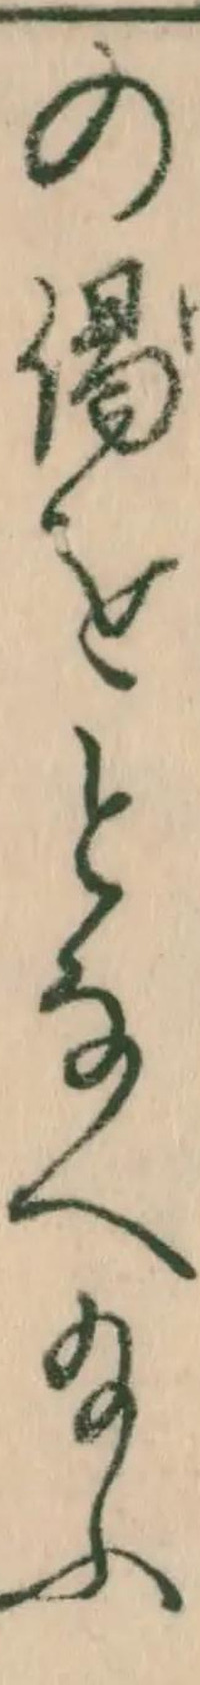の偈をとなへ給ふ
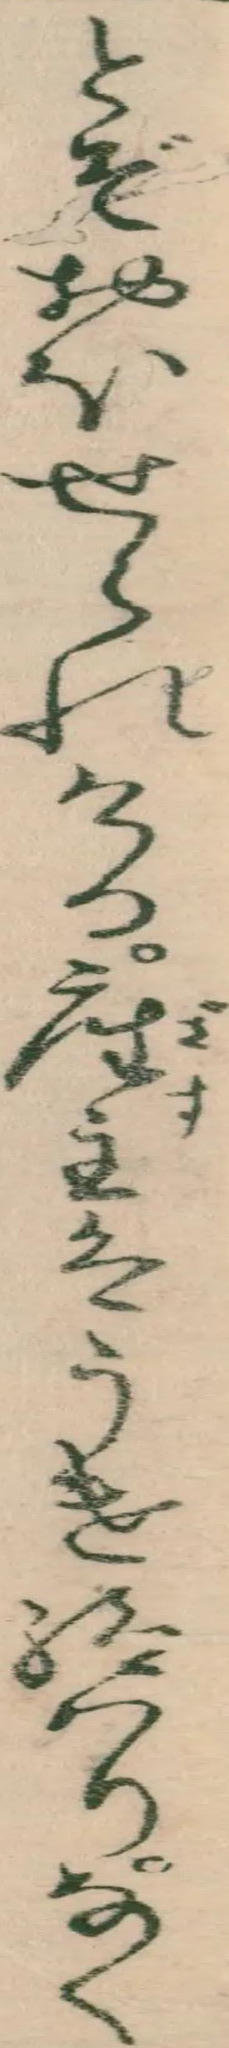とぞおほせられける。座主はうけ給はり。なく
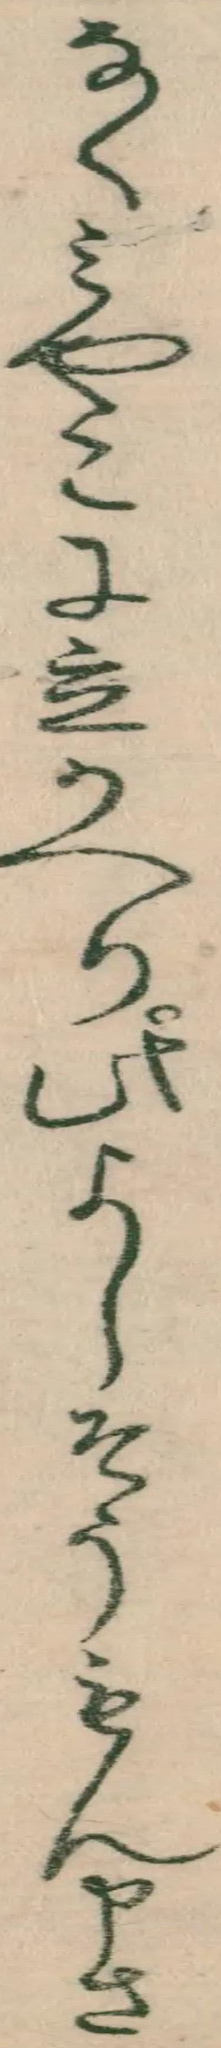なくみやこに立かへり。此よしそうもん申さ
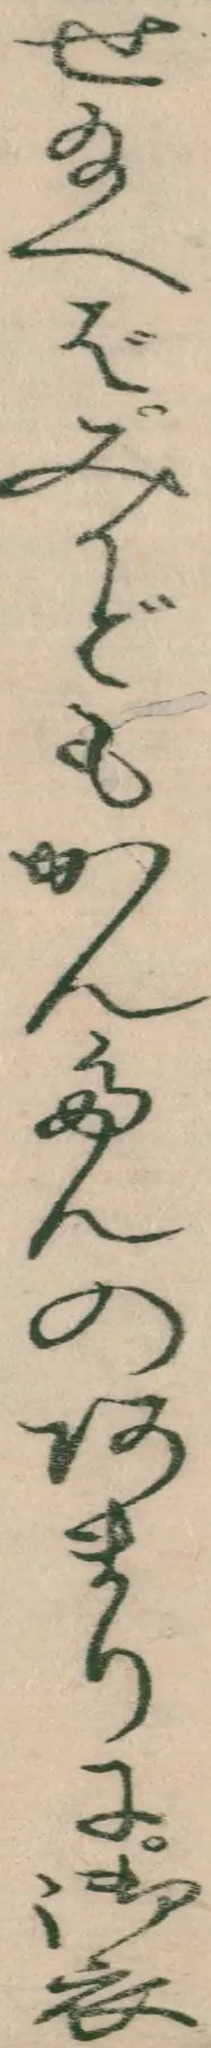せ給へば。みかどもかんたんのあまりに。御衣
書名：弘法大師御本地 3巻. [3]
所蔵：国立国会図書館 National Diet Library, JAPAN
